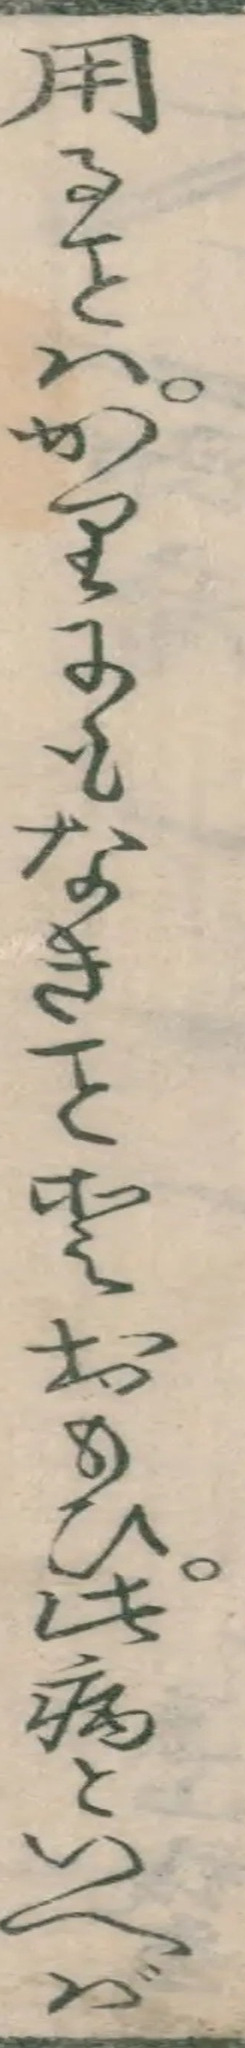用ることは。かりにもなきことのおもひ。此病といへば

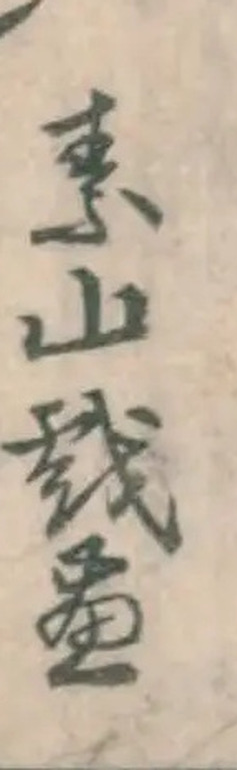素山戯尽
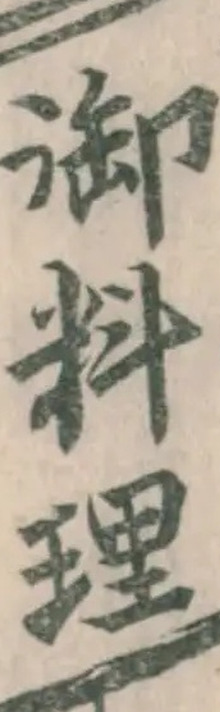御料理
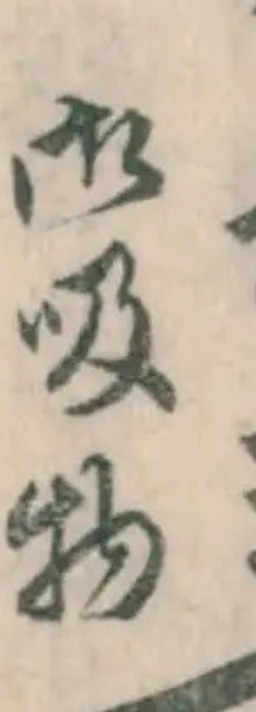御吸物
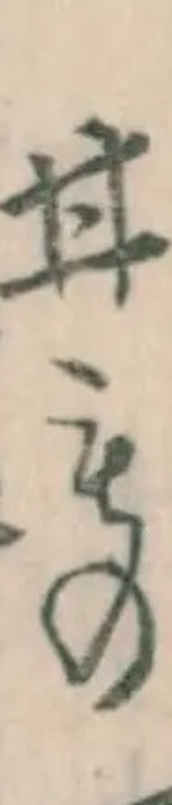丼もの
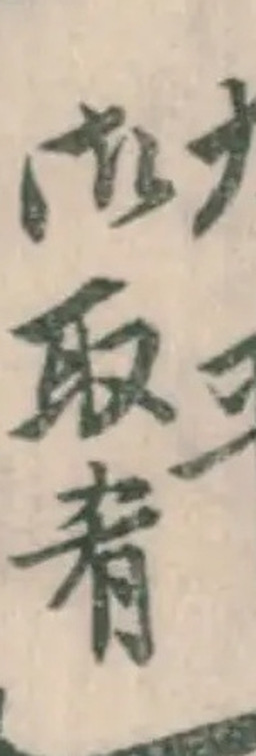御取肴
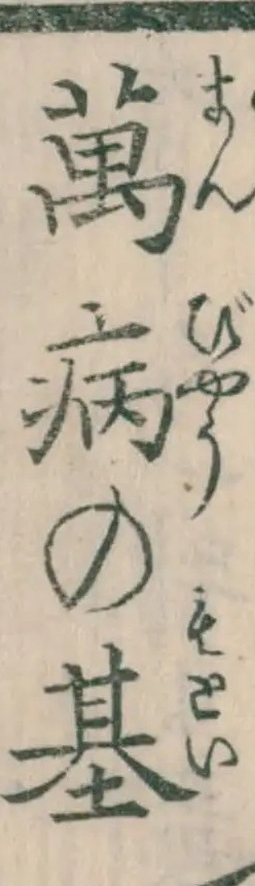萬病の基

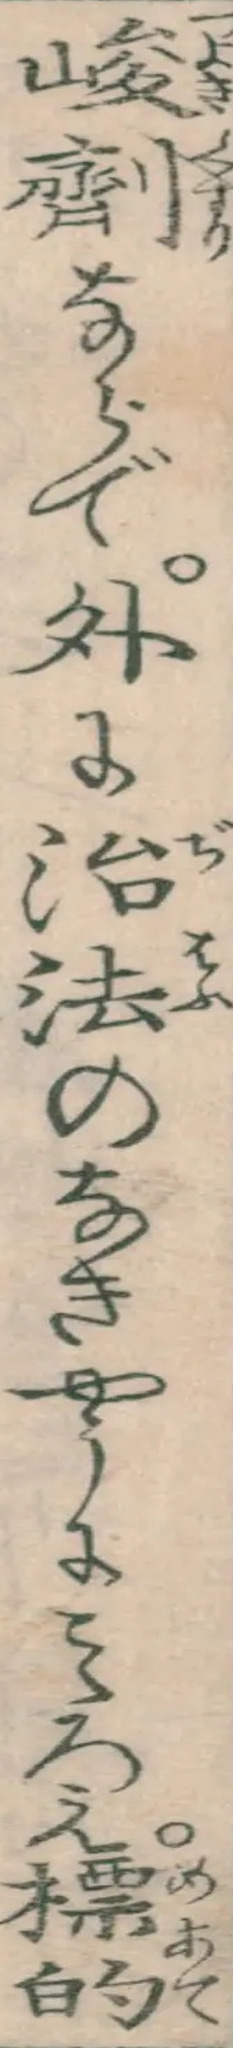峻劑ならで。外に治法のなきやうにこゝろえ。標的
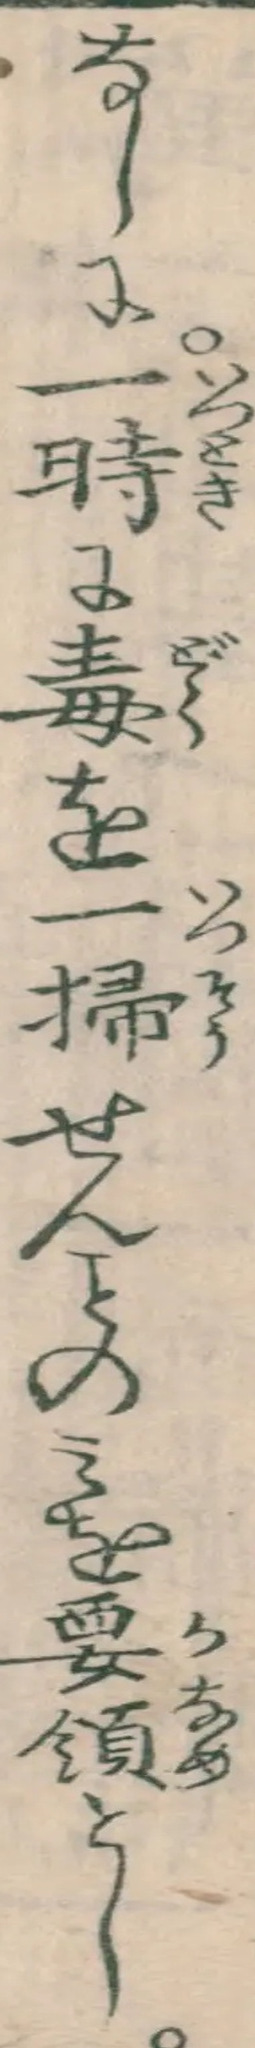なしに。一時に毒を一掃せんことのみを要領とし。
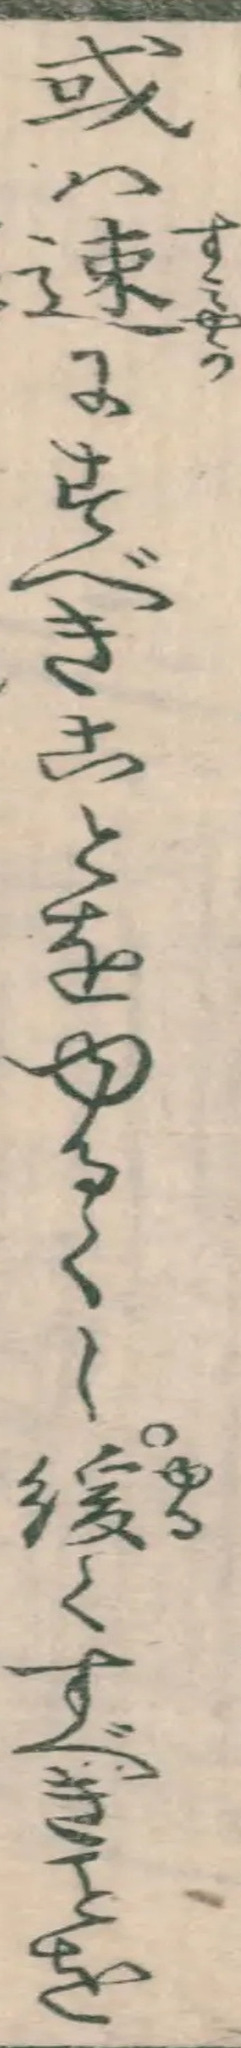或は速にすべきことをゆるくし。緩くすべきことを
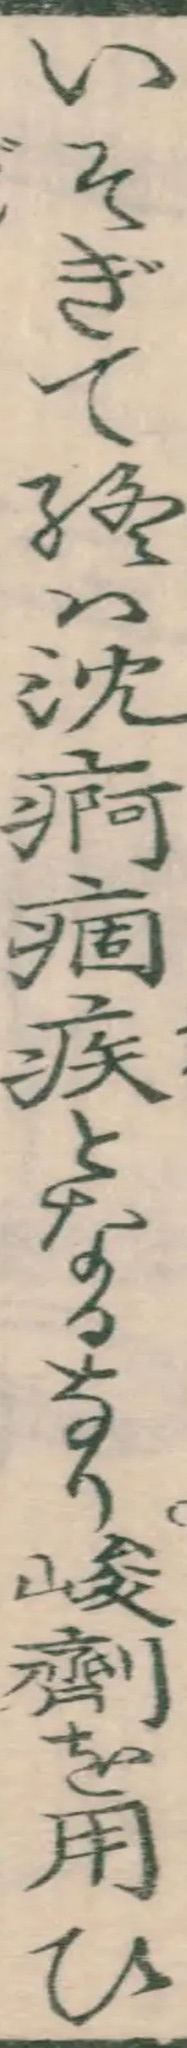いそぎて終は沈痾痼疾となるなり。峻劑を用ひ
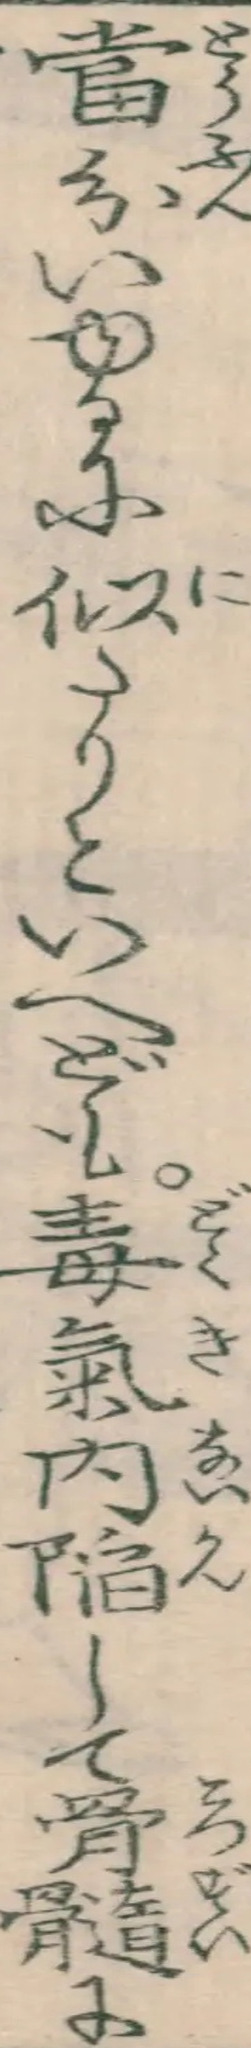當分いゆるに似たりといへども。毒氣内陥して骨髄に
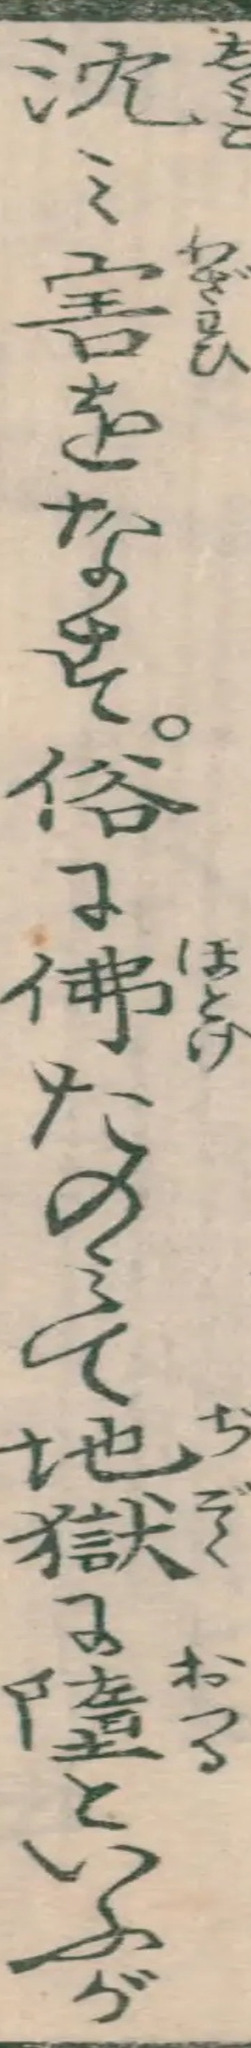沈み害をなす。俗に佛たのみて地獄に堕といふが
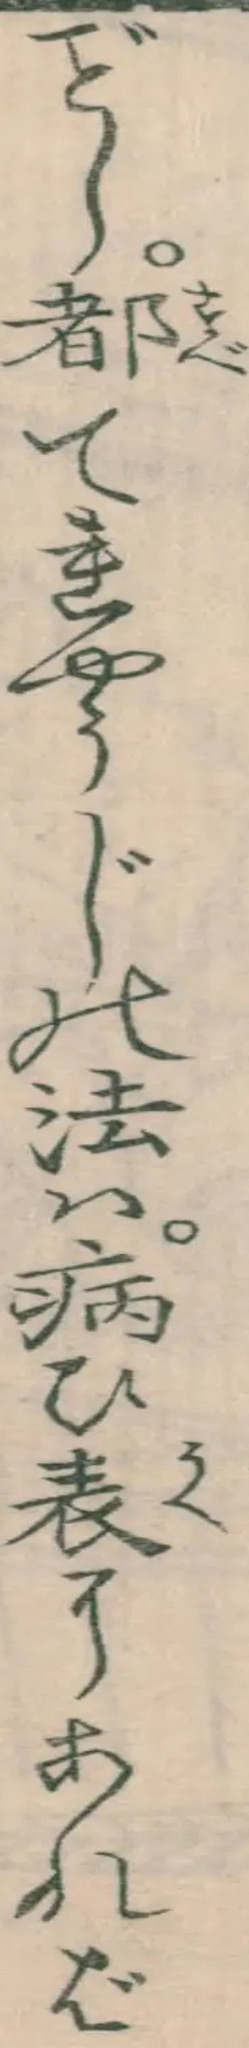ごとし。都てれやうじの法は。病ひ表にあれば
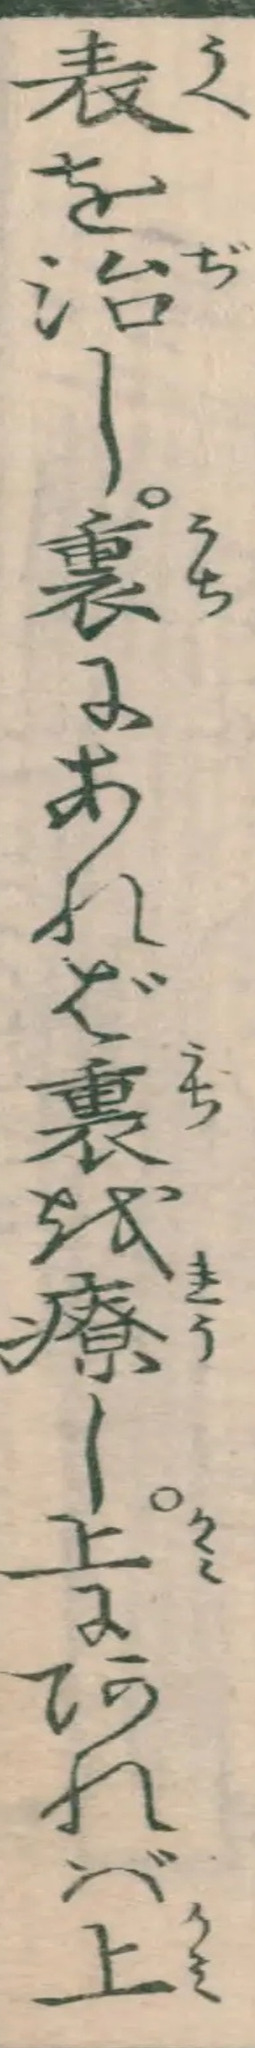表を治し。裏にあれば裏を療し。上にあれば上
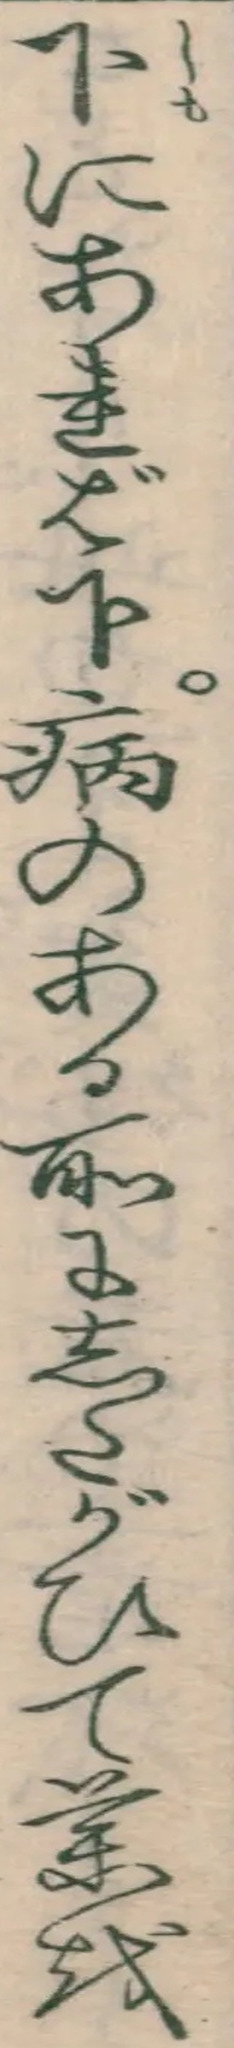下にあれば下。病のある所にしたがひて藥を
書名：瘡家示訓
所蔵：国立国会図書館 National Diet Library, JAPAN
